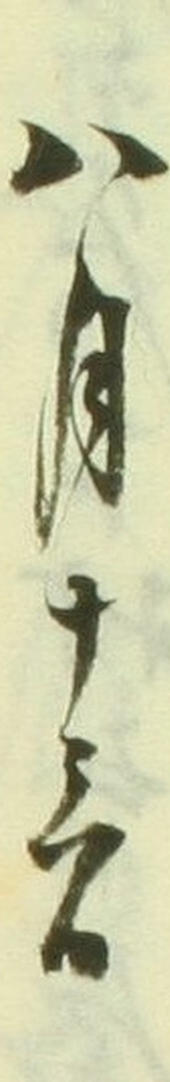八月十三日
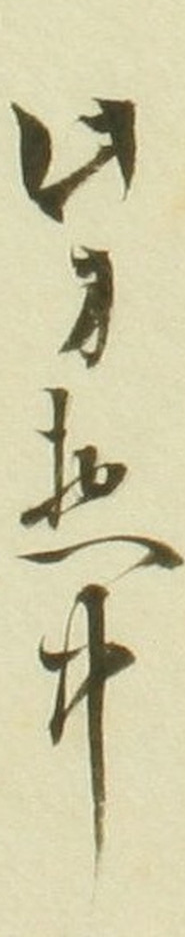此方惣中
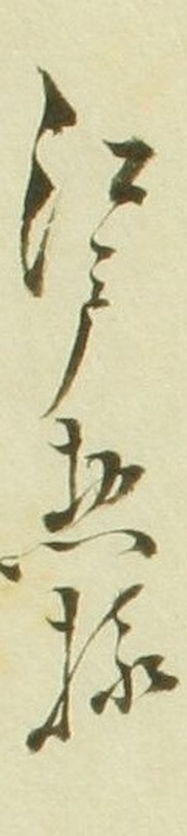江戸惣様
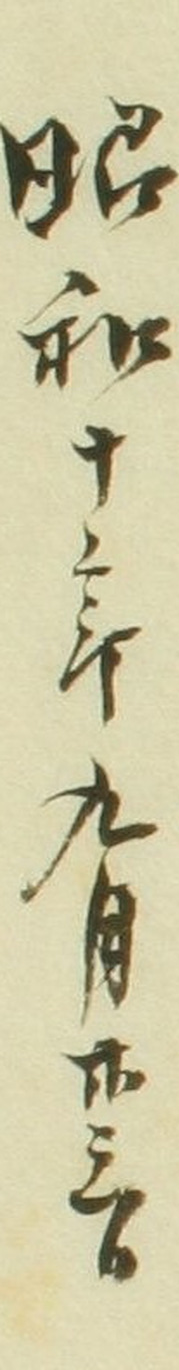昭和十二年九月廿三日
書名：異国船漂着記
